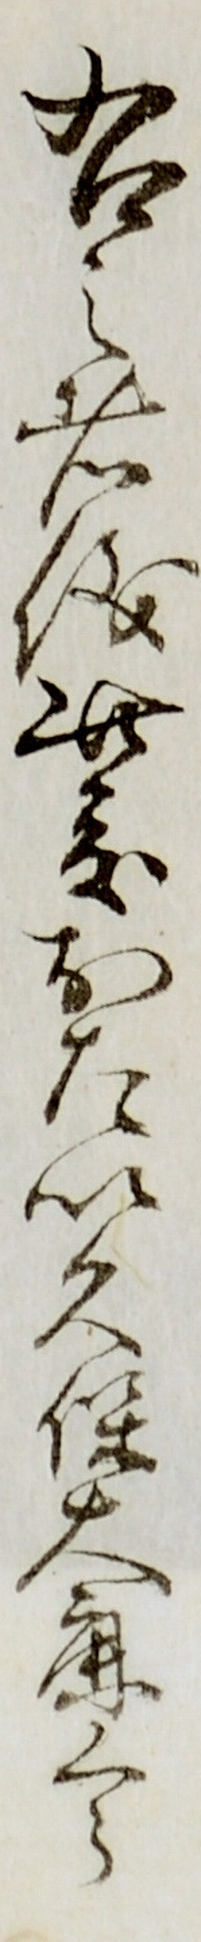右之者儀此度おたい久保大鹿くら
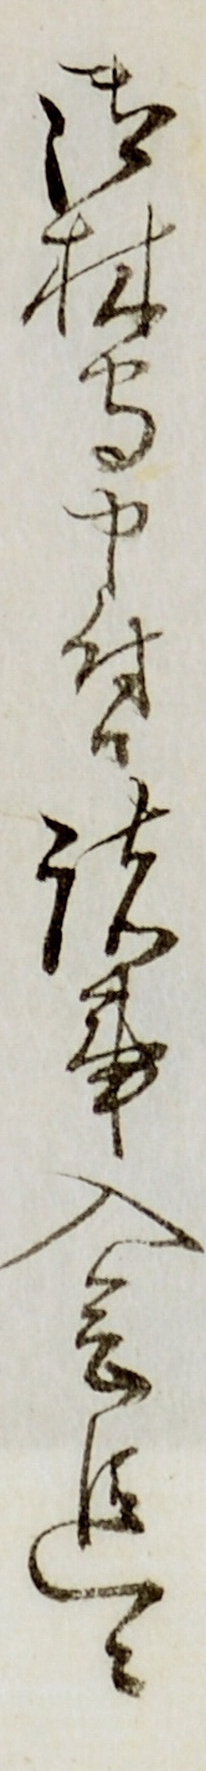御林守申付候諸事入念追々
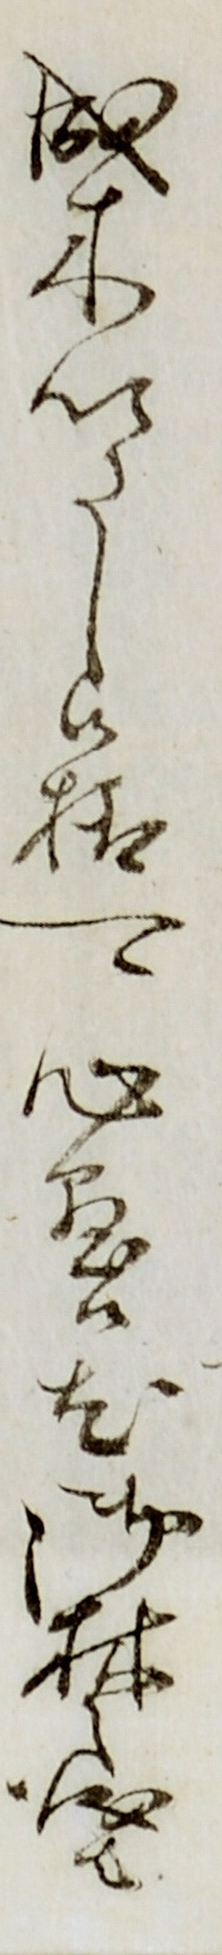成木いたし候様可心懸候尤御林之儀は
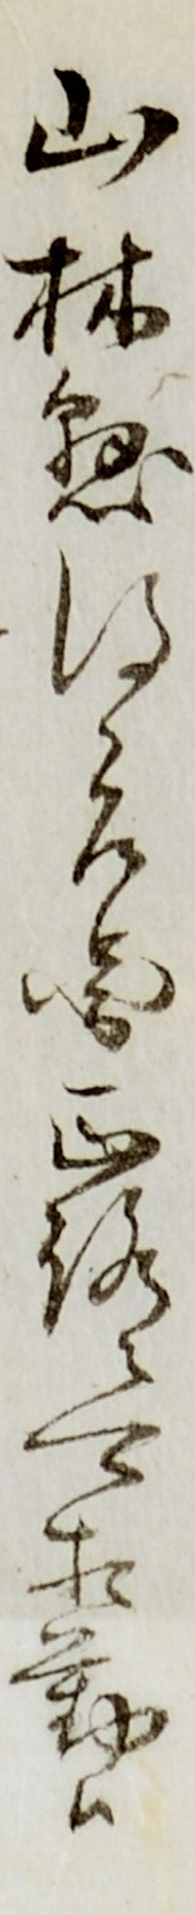山林懸得差図正路に可相勤候
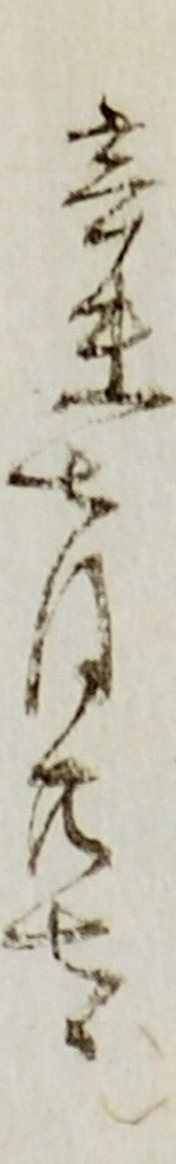辛未七月廿七日
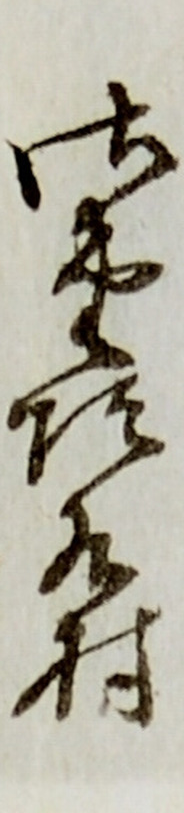御堂垣外村
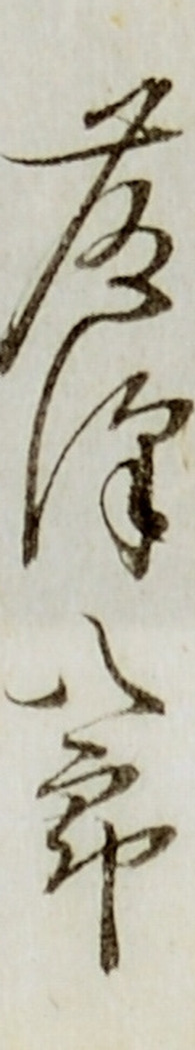藤沢八郎
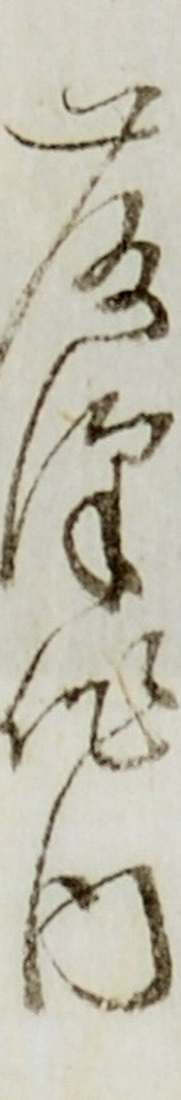藤沢作内
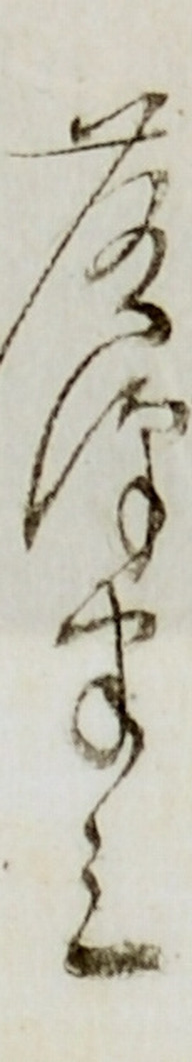藤沢半三
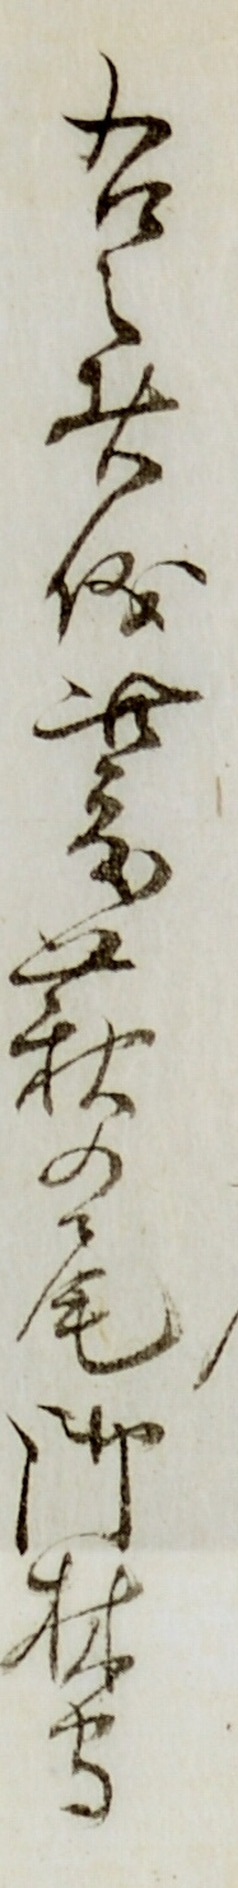右之者儀此度萩の尾御林守
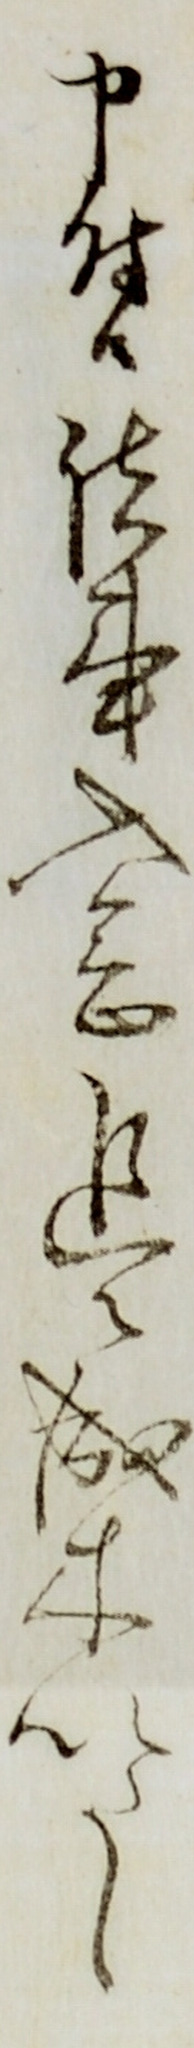申付候諸事入念追々成木いたし
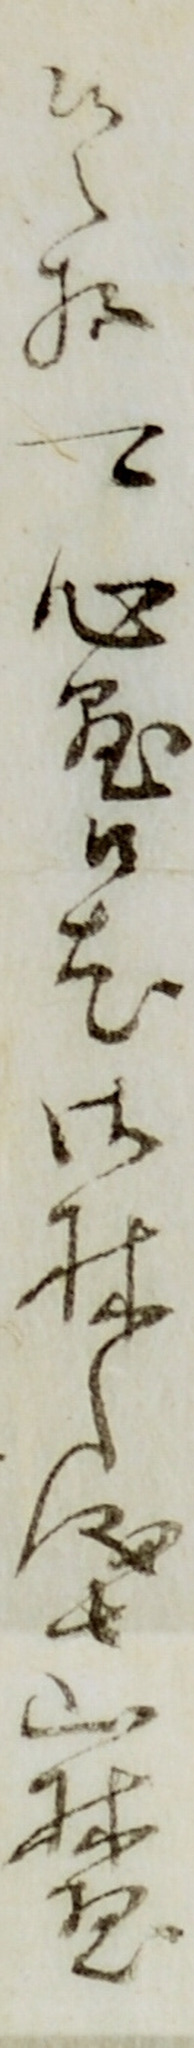候様可心懸候尤御林之儀は山林懸

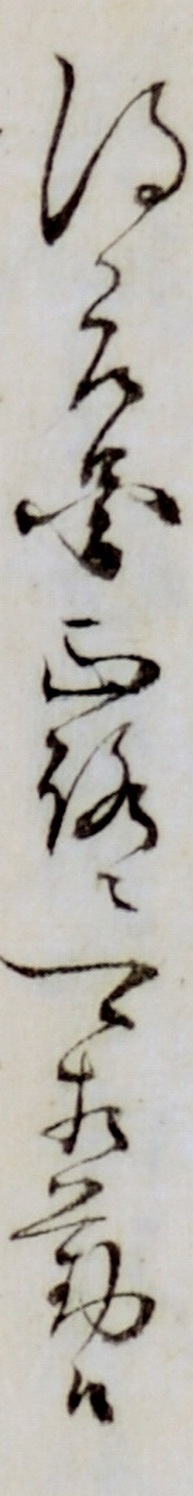得差図正路に可相勤候
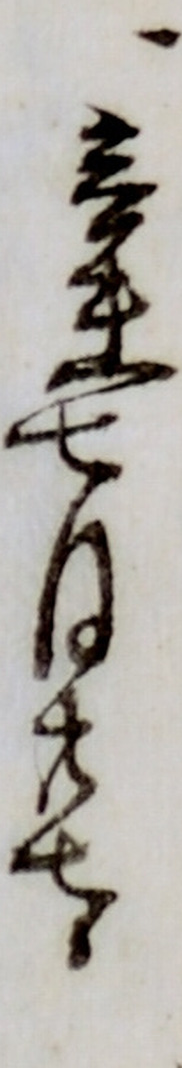辛未七月廿七日
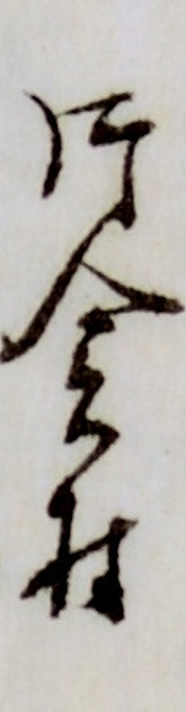片倉村
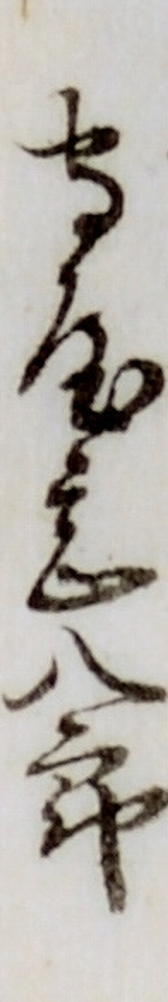守屋甚八郎
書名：山林方諸事御用留
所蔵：伊那市立高遠町図書館・合同会社AMANE
